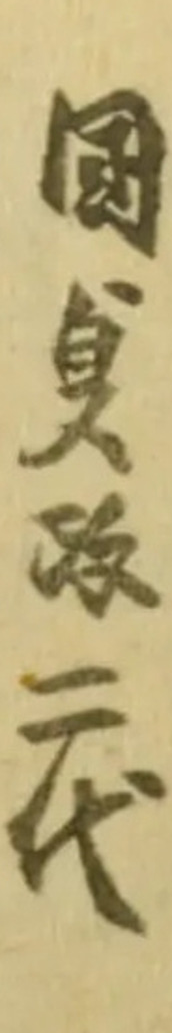國貞改二代
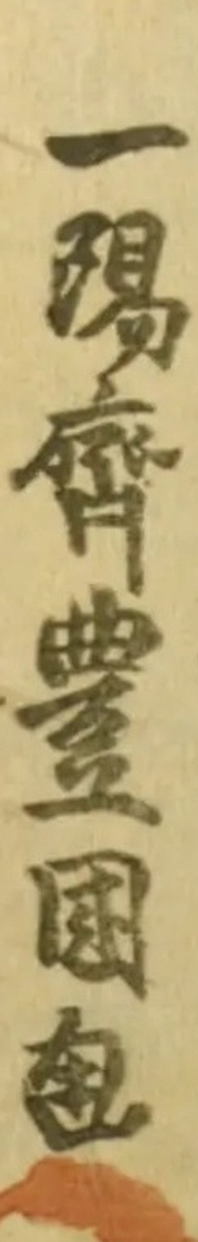一陽齊豊國画
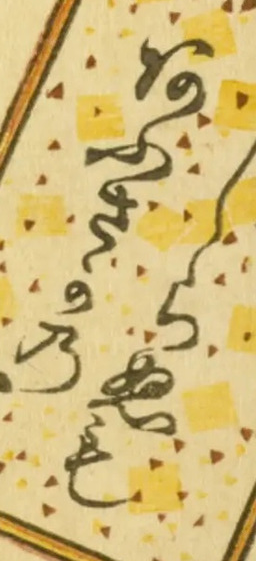あふさかの関
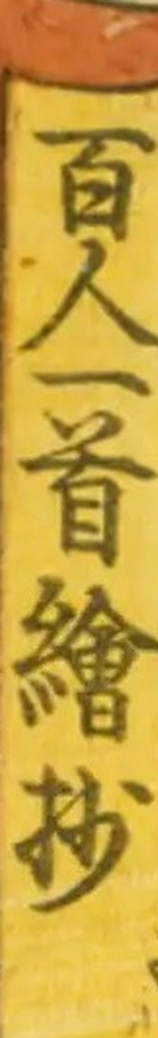百人一首繪抄
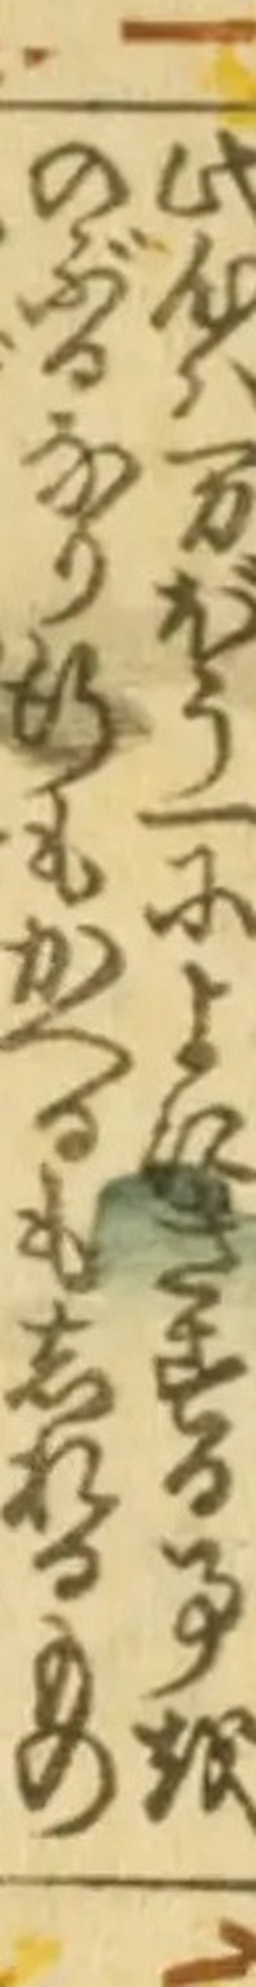のぶるなり行くもかへるもしれるもの
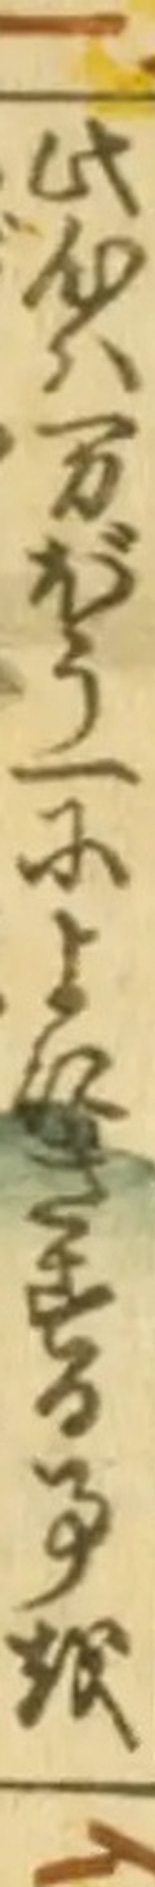此心は万ぼう一によにきする事を
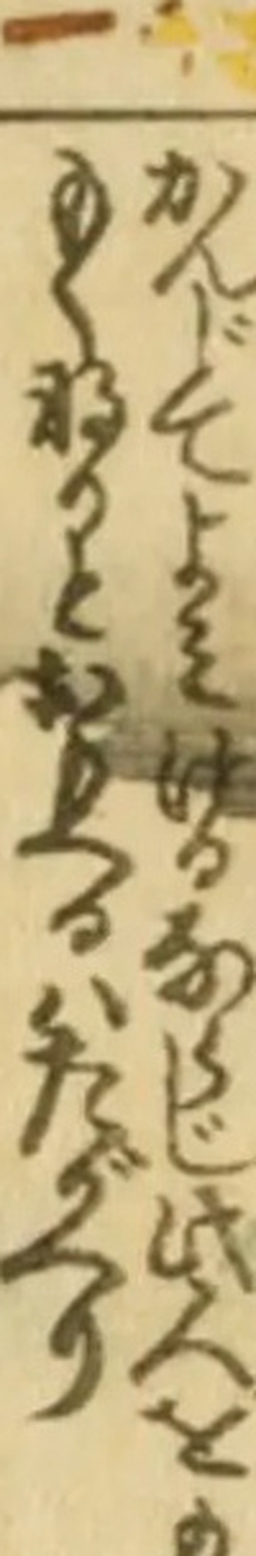もくなりとおもへるはたがへり
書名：百人一首絵抄　十　蝉丸
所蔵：国立国会図書館 National Diet Library, JAPAN
